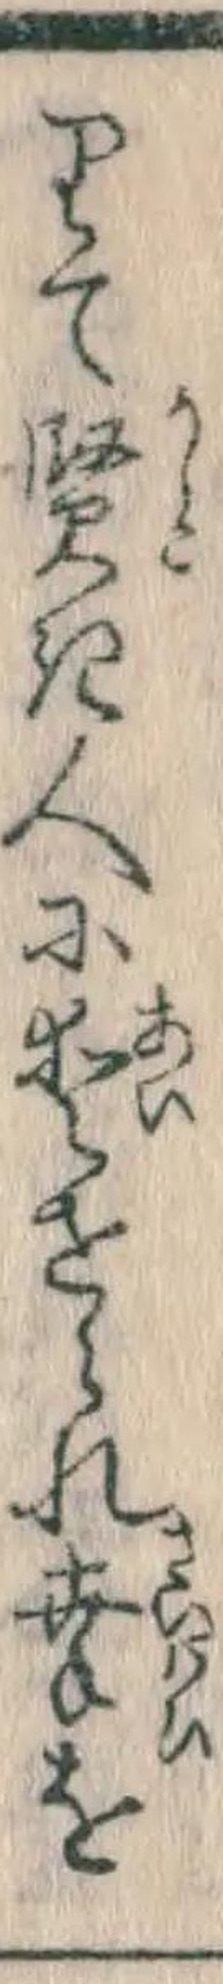りて賢き人に愛せられ幸を
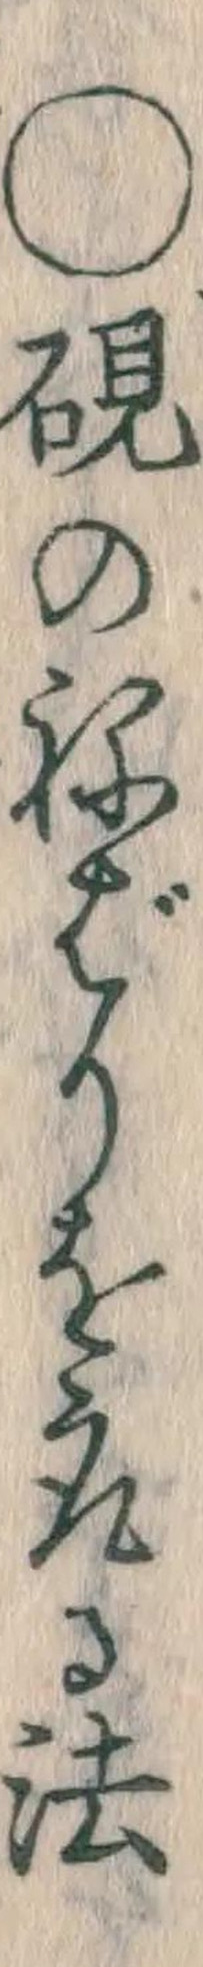○硯のねばりを取る法
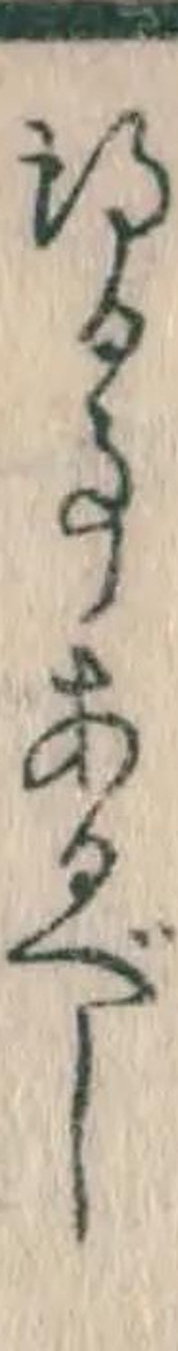得る事あるべし
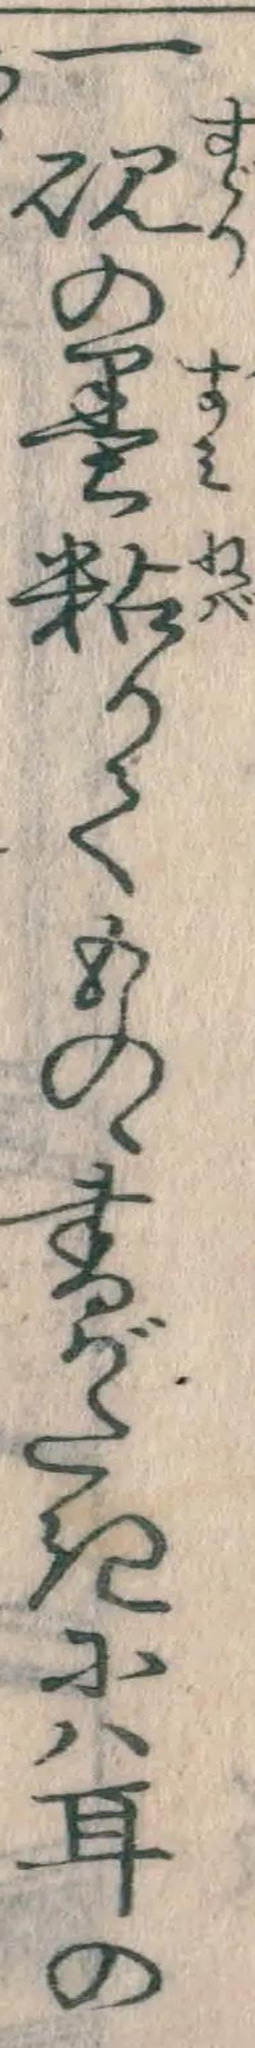一硯の墨粘りてものゝ書がたきには耳の
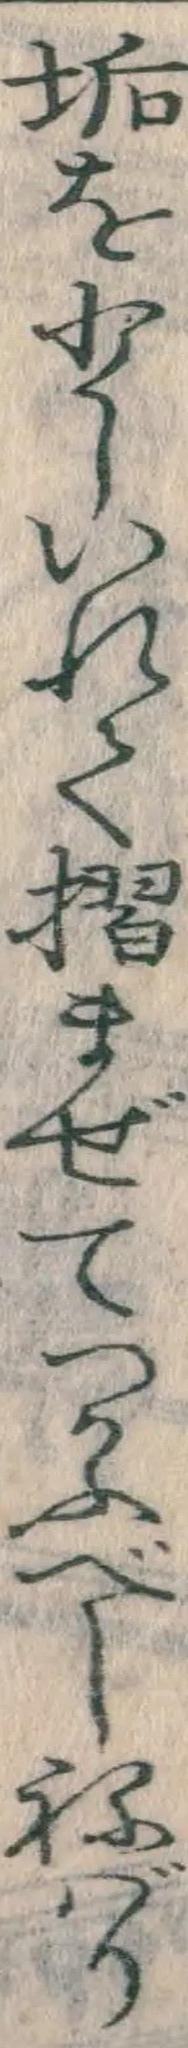垢を少しいれて摺まぜてつかふべしねばり
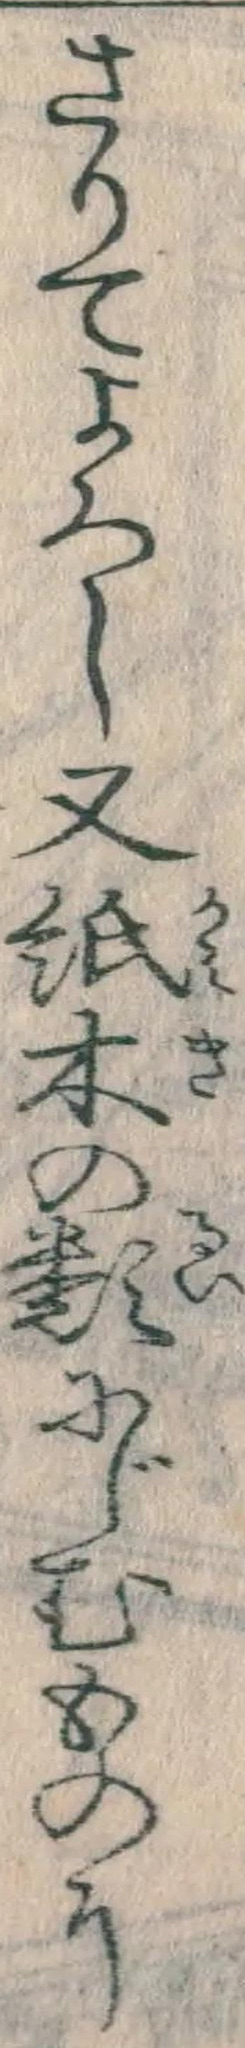さりてよろし又紙木の類にじむものに
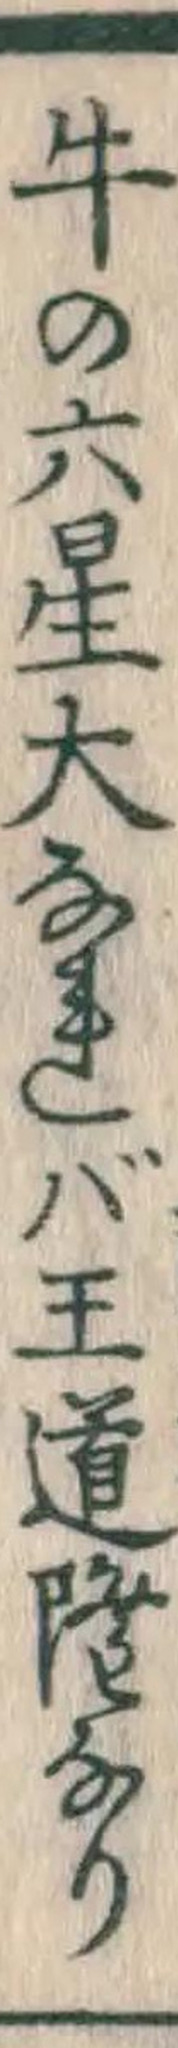牛の六星大なれば王道隆なり
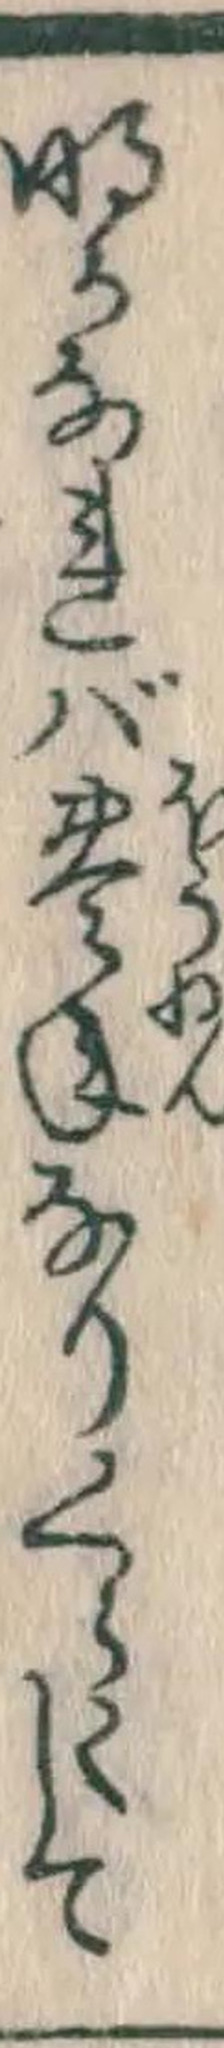明かなれば豊年なりくらくして
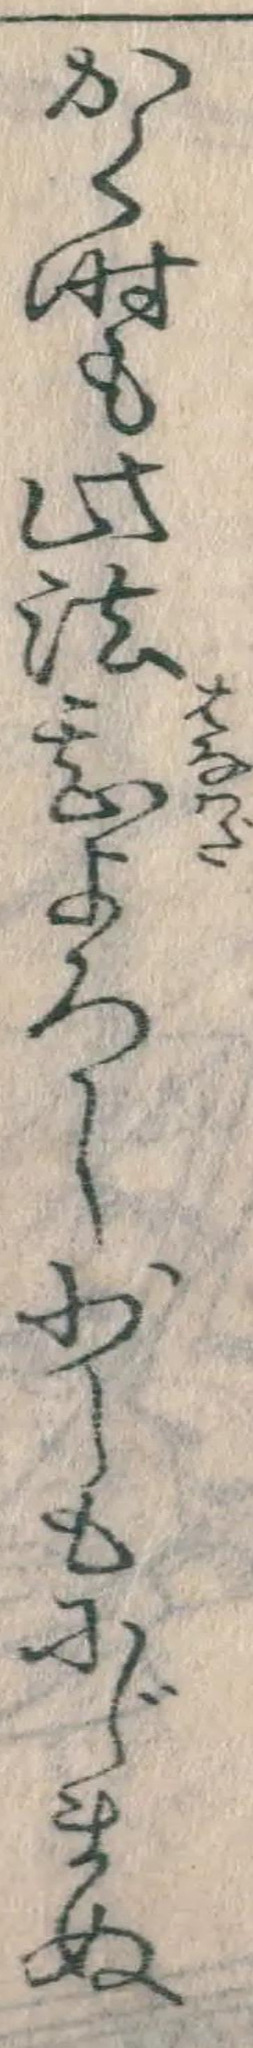かく時も此法甚よろし少しもにじまぬ
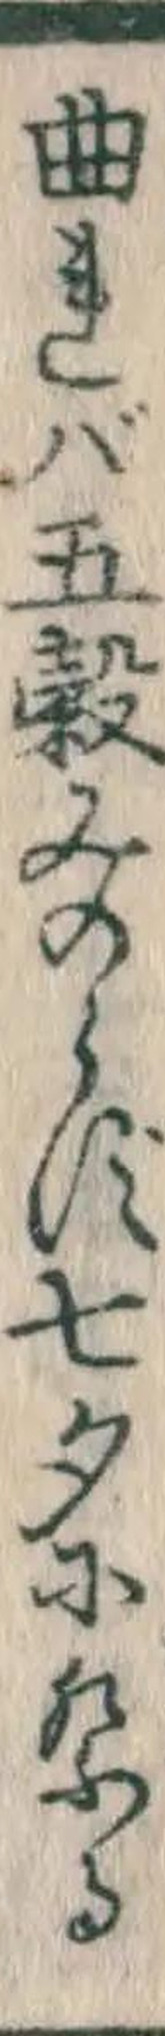曲れば五穀みのらず七夕に祭る
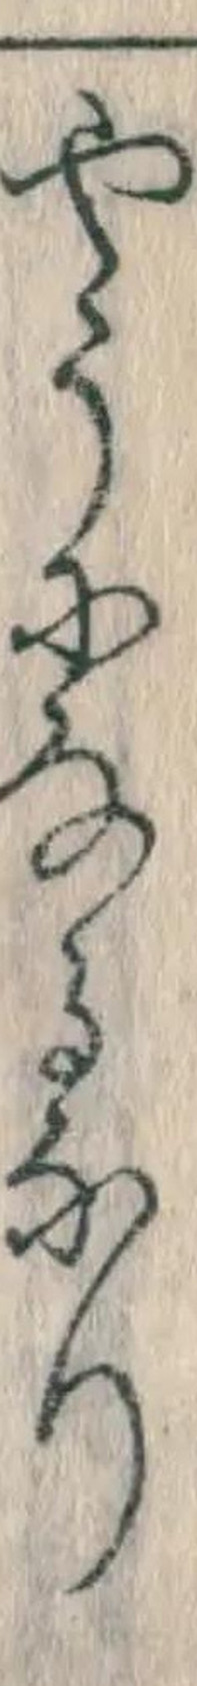やうになるなり
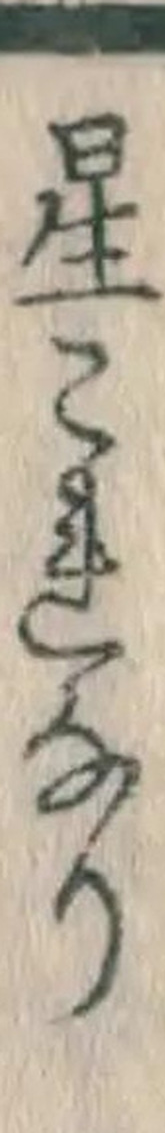星これなり
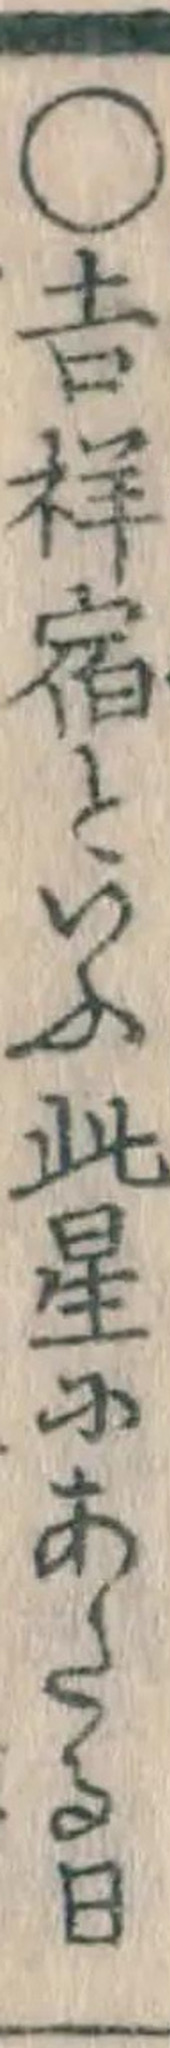○吉祥宿といふ此星にあたる日
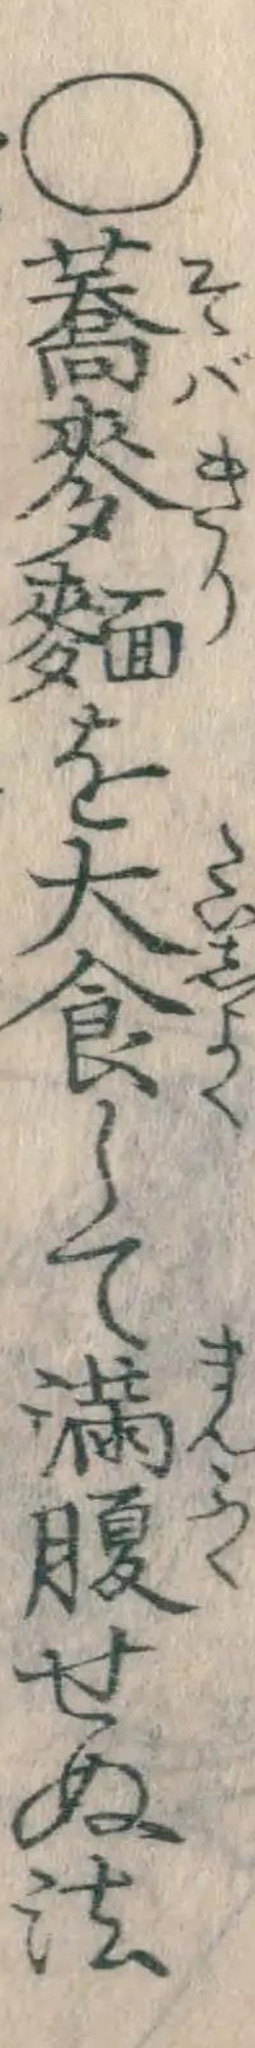○蕎麦麺を大食して満腹せぬ法
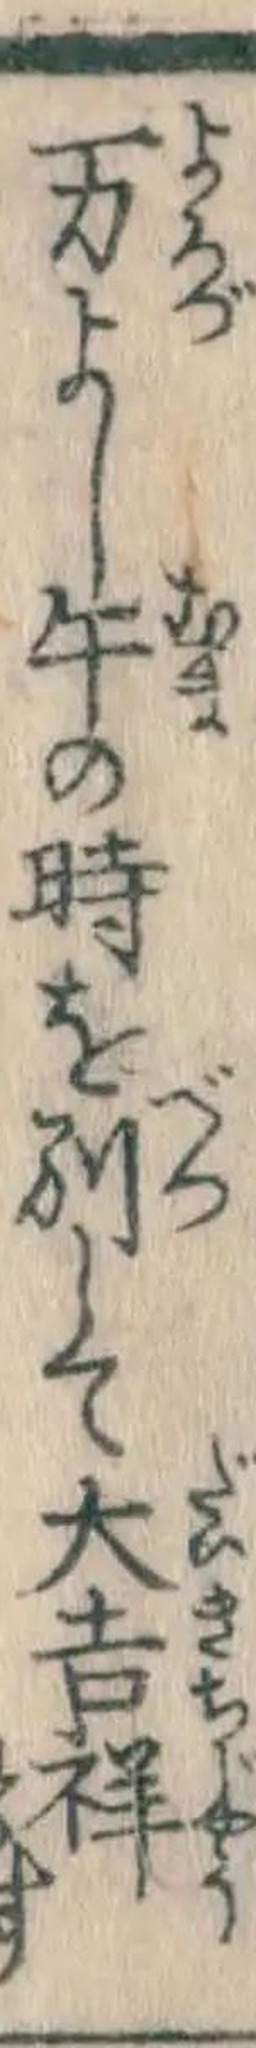万よし午の時を別して大吉祥とす
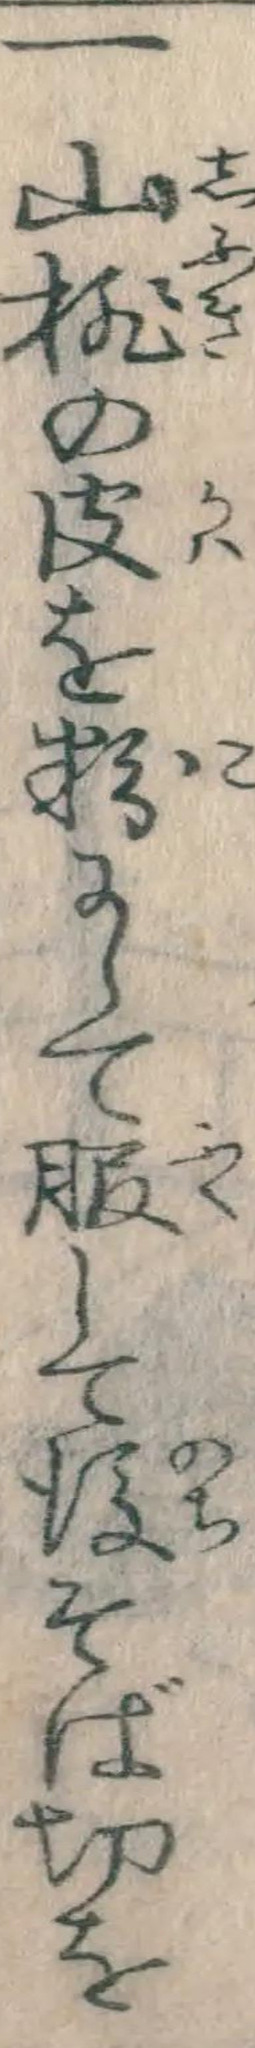一山桃の皮を粉にして服して後そば切を
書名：広益秘事大全 3巻. [2]
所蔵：国立国会図書館 National Diet Library, JAPAN
